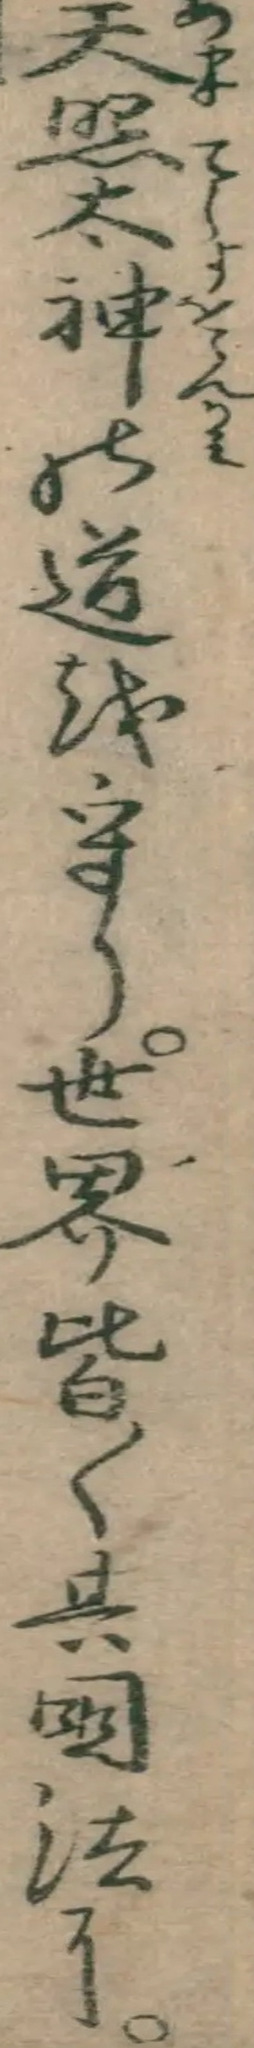天照太神の道を守り。世界皆〳〵其国法に。
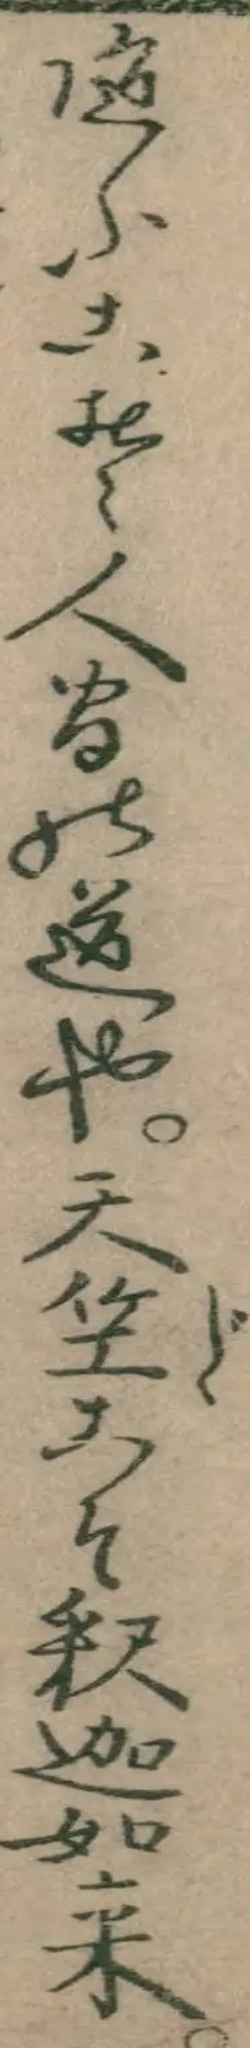随ふこそ人間の道也。天竺こそ釈迦如来。
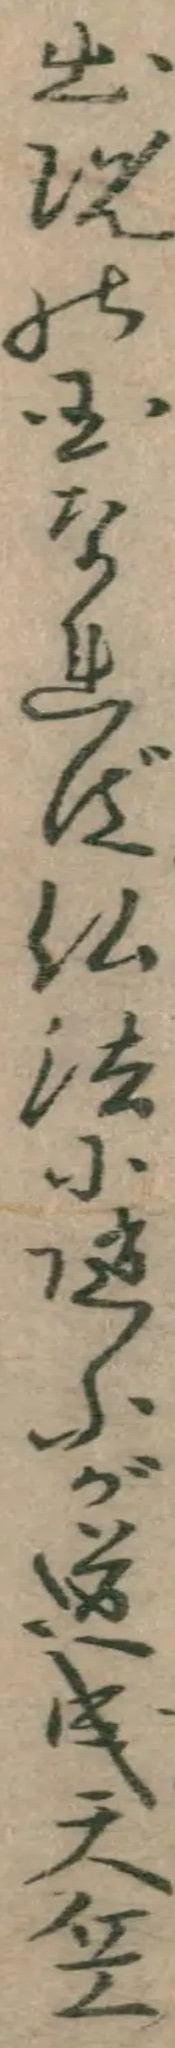出現の国なれば。仏法に随ふが道成。天竺
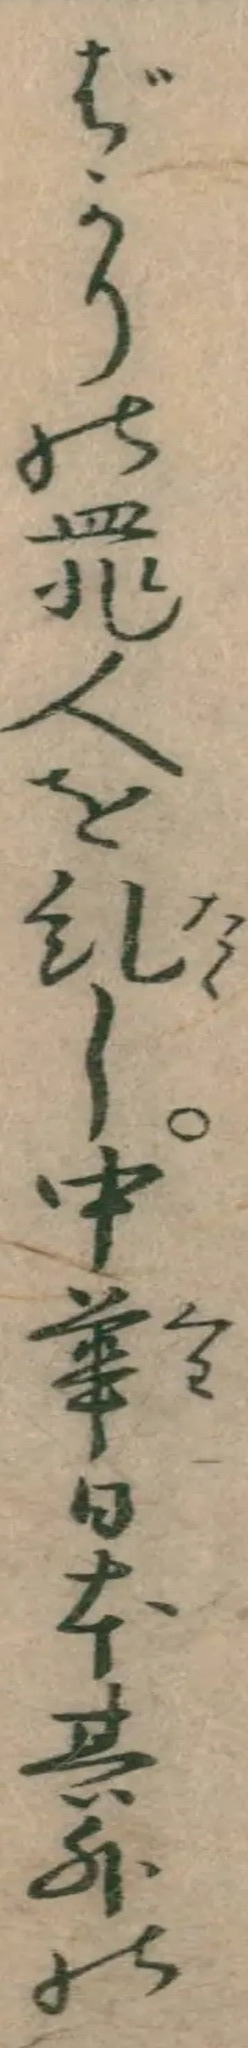ばかりの罪人を糺し。中華日本其外の
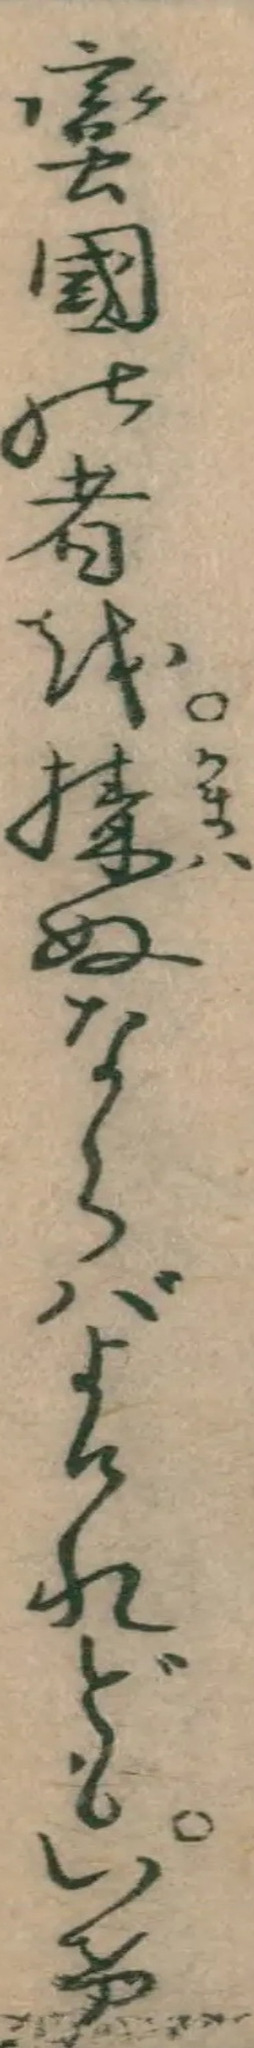蛮国の者を。構ぬならばよけれども。いけ
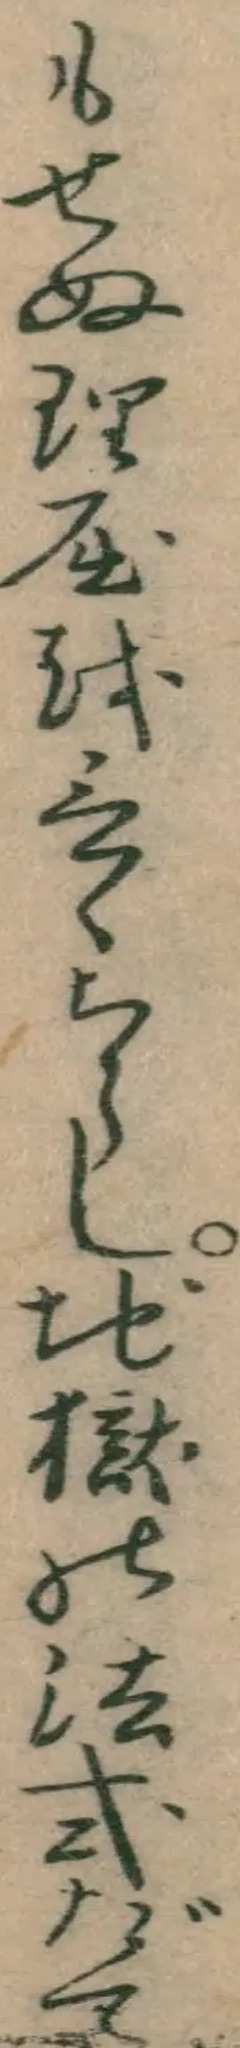もせぬ理屈を言ゝちらし。地獄の法式だて
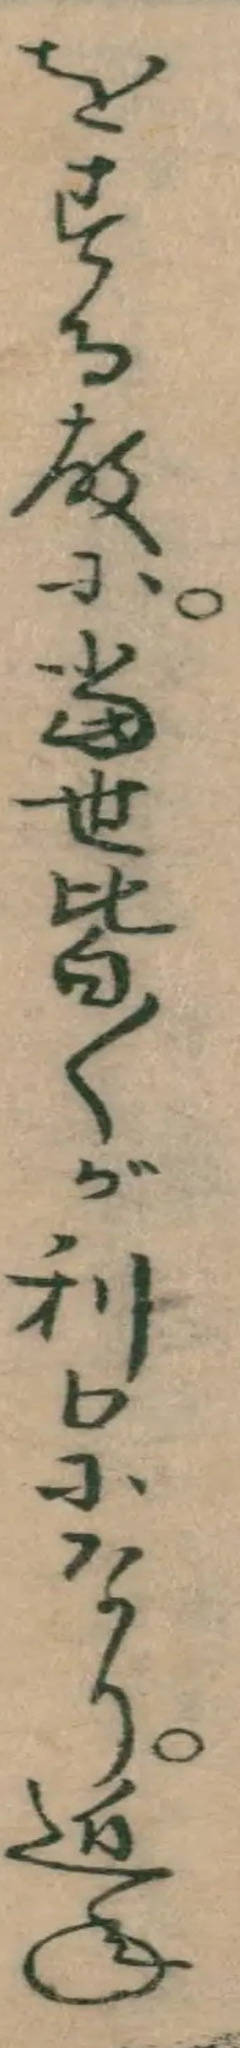をする故に。当世皆〳〵が利口になり。近年
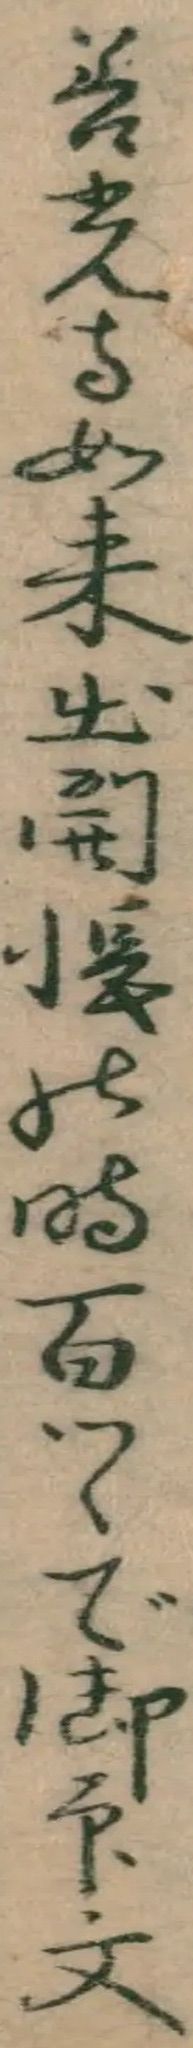善光寺如来。出開帳の時。百ツヽで。御印文
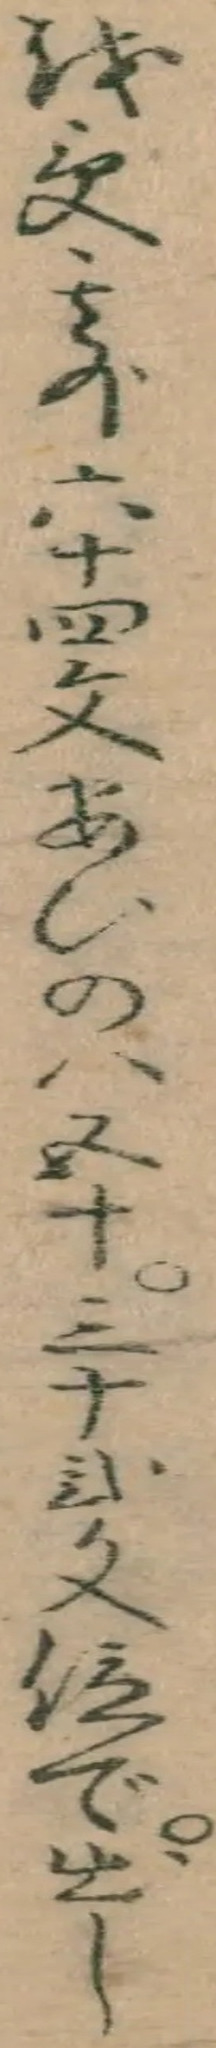を受其外六十四文あひのは五十。三十弐文位で。出し
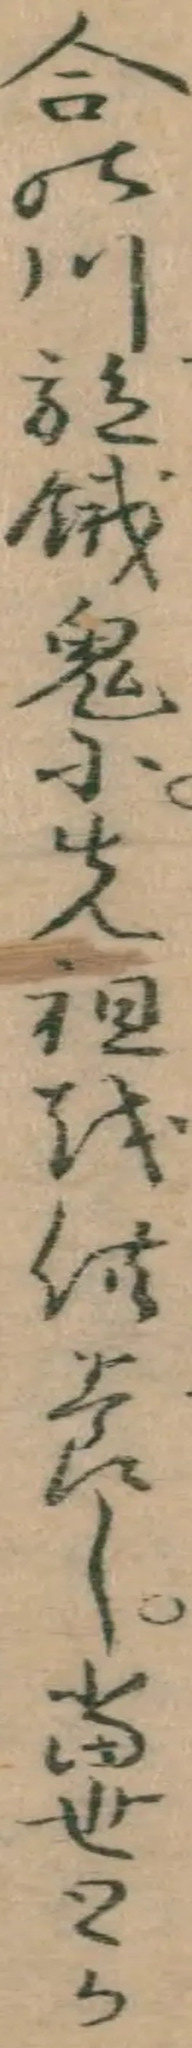合の川施餓鬼に。先祖を供養し。当世とか
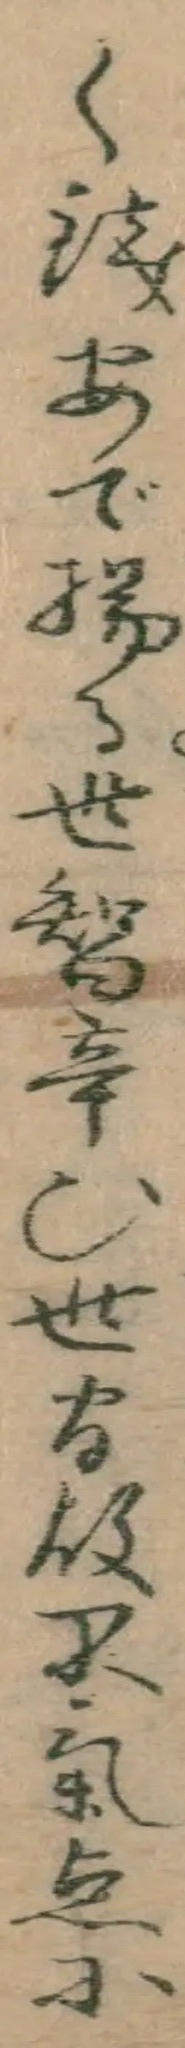く銭安で揚る。世智辛ひ世間故。不気点に
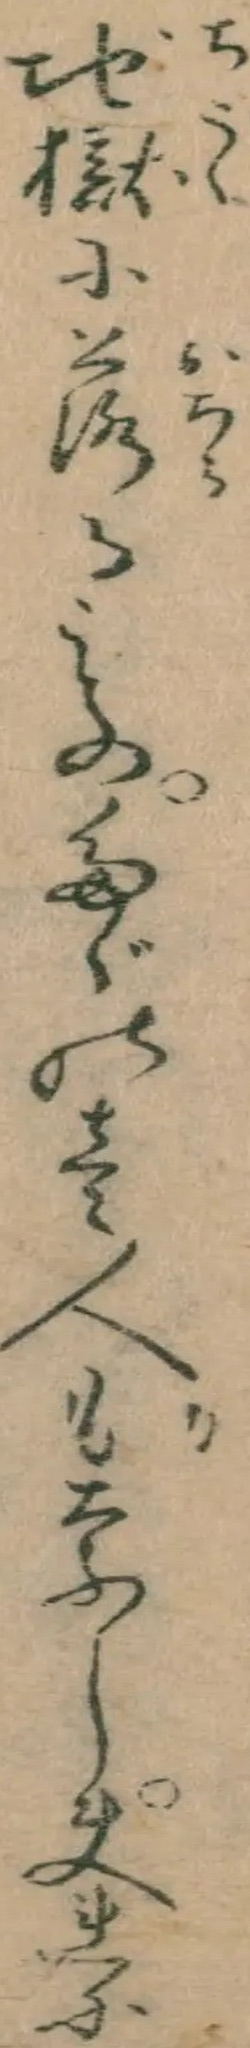地獄に落ることの。たゞの壱人もなし。夫れに
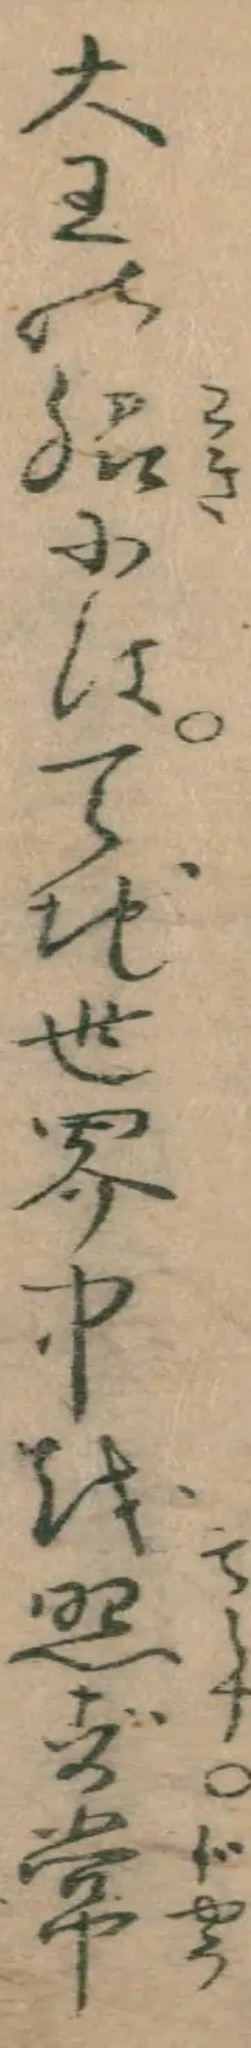大王の脇には。天地世界中を照ず。常
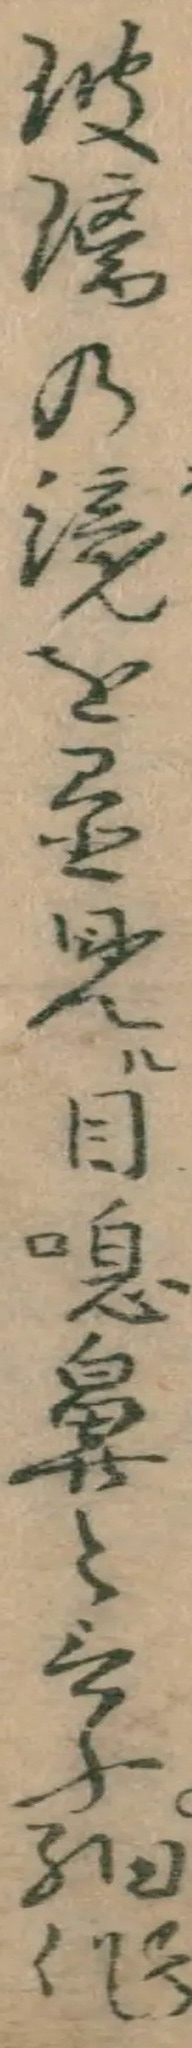玻璃の鏡を置。見目嗅鼻と言ふ。細作
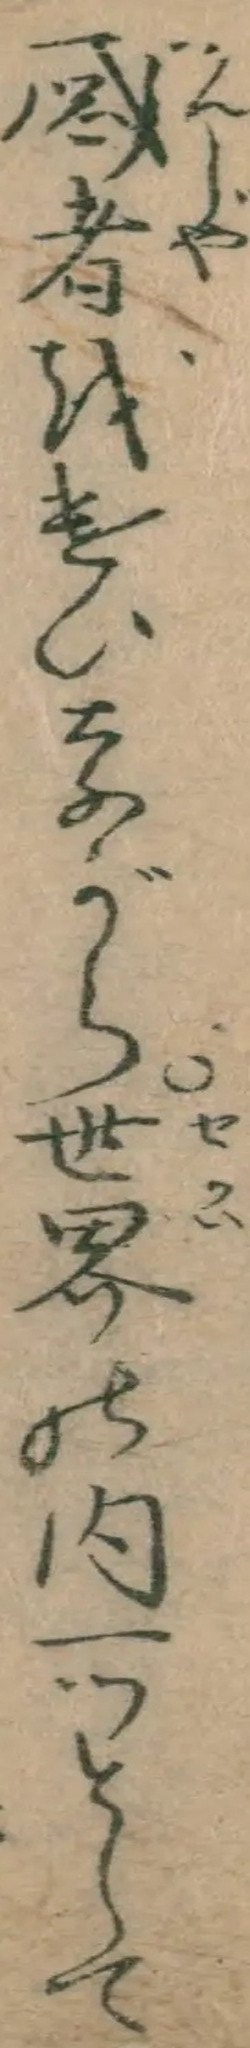感者を遣ひながら。世界の内一ツとして
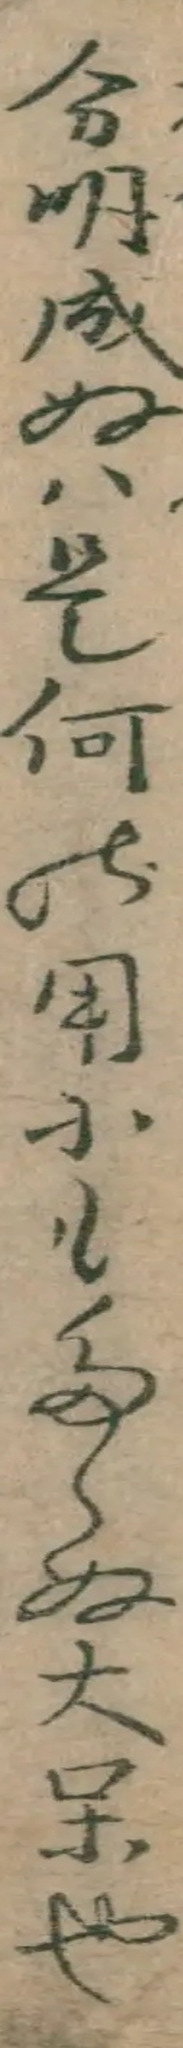分明成ぬは。是何の用にもたらぬ。大呆也。
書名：翻草盲目
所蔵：国立国会図書館 National Diet Library, JAPAN
